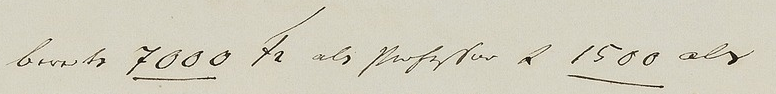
bereits 7000 Fr als Professor & 1500 als
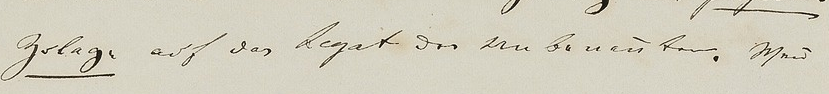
Zulage auf das Legat des Unbenannten. Wenn
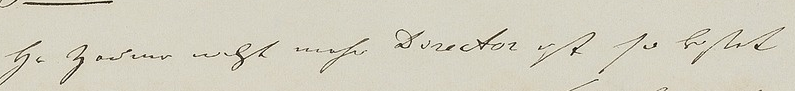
Hr Zeuner nicht mehr Director ist so kostet
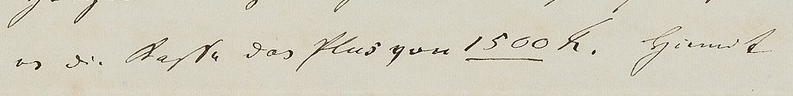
es die Kasse das Plus von 1500 Fr. Hiemit
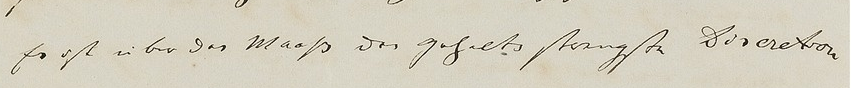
Es ist über das Maaß des Gehalts strengste Discretion
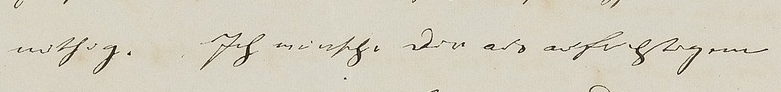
nöthig. Ich wünsche Dir aus aufrichtigem
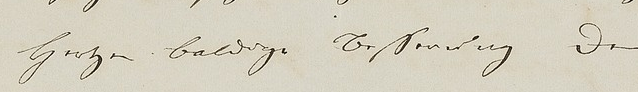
Hertzen baldige Besserung Dein
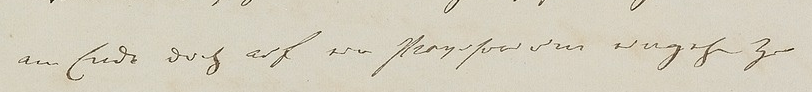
am Ende doch auf ein Provisorium eingehen zu
